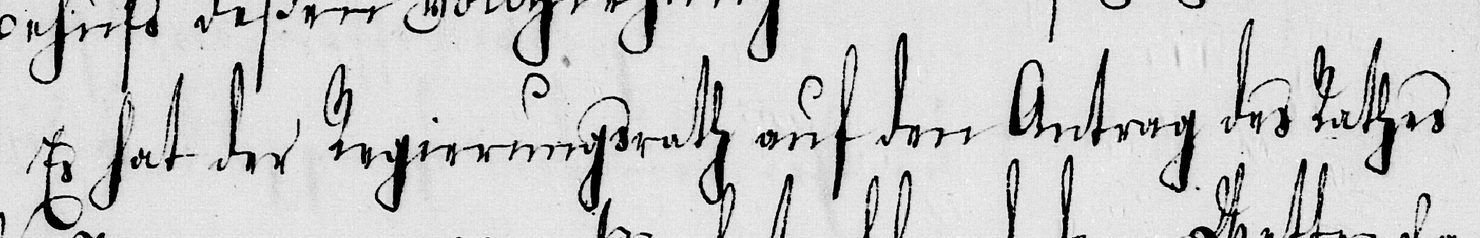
Es hat der Regierungsrath auf den Antrag des Rathes
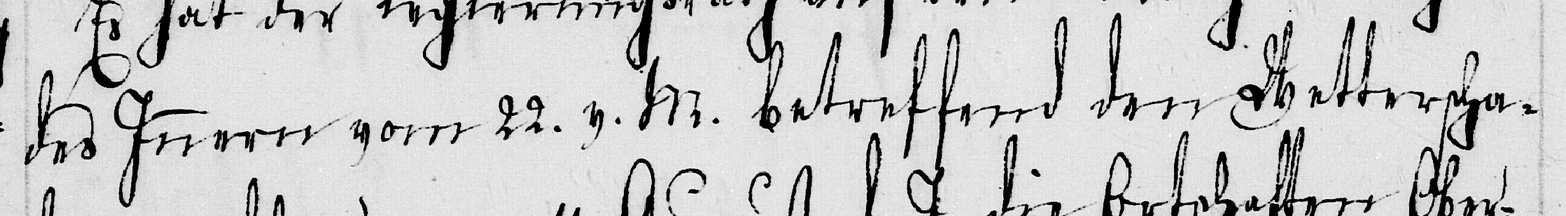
des Innern vom 22. v. M. betreffend den Wetterscha¬
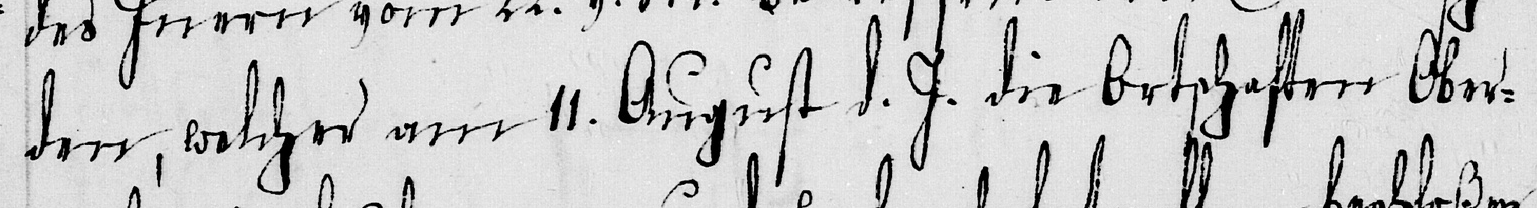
den, welcher am 11. August d. J. die Ortschaften Obe¬
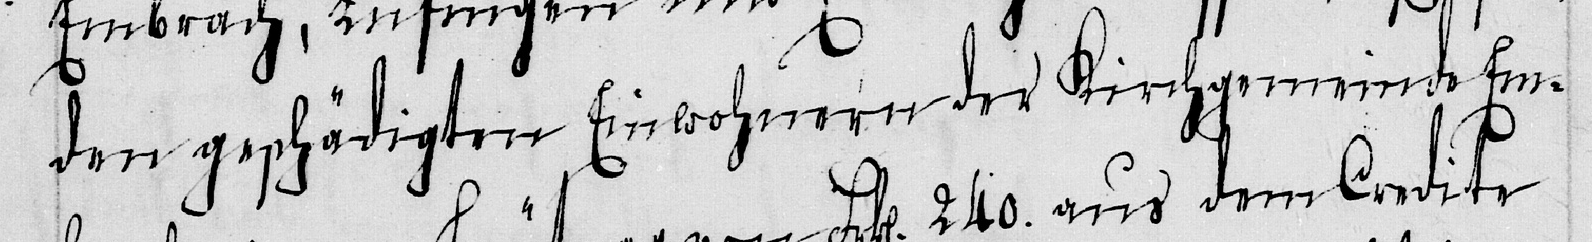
den geschädigten Einwohnern der Kirchgemeinde Em¬
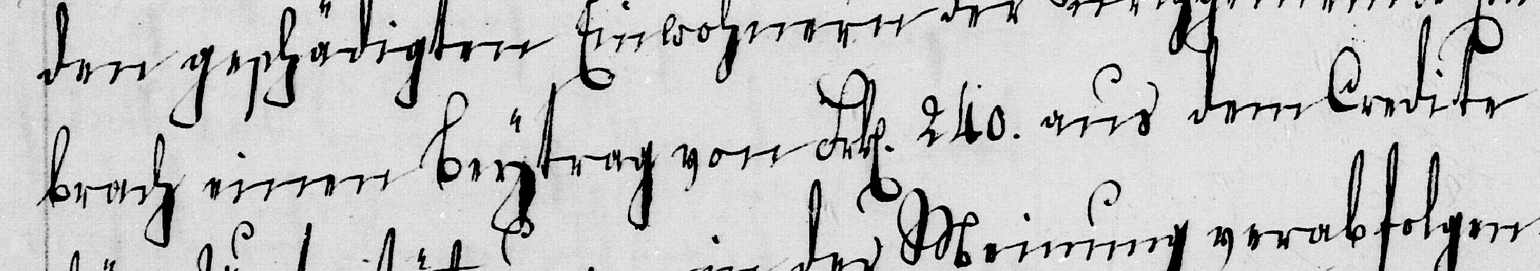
brach einen Beytrag von Frk[en] 240. aus dem Credite
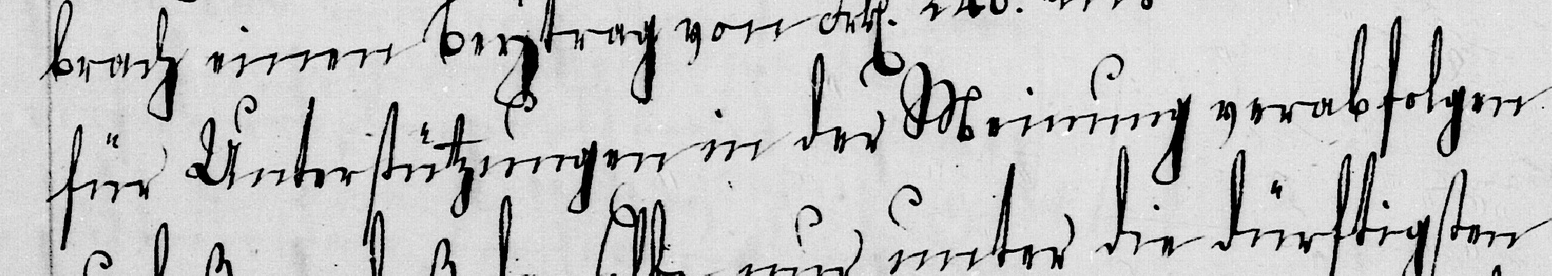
für Unterstützungen in der Meinung verabfolgen
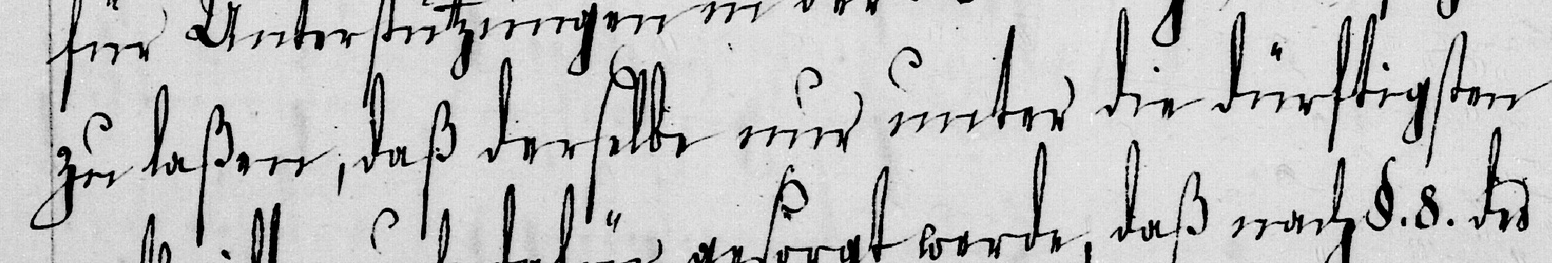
zu laßen, daß derselbe nur unter die dürftigsten
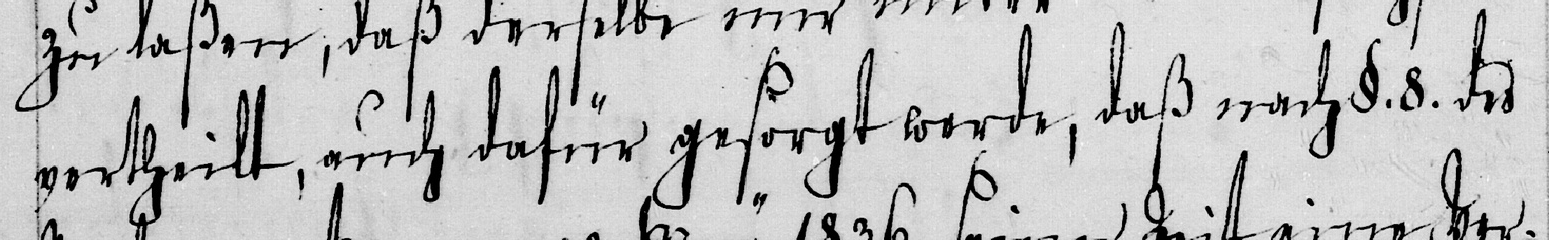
vertheilt, auch dafür gesorgt werde, daß nach §. 8.
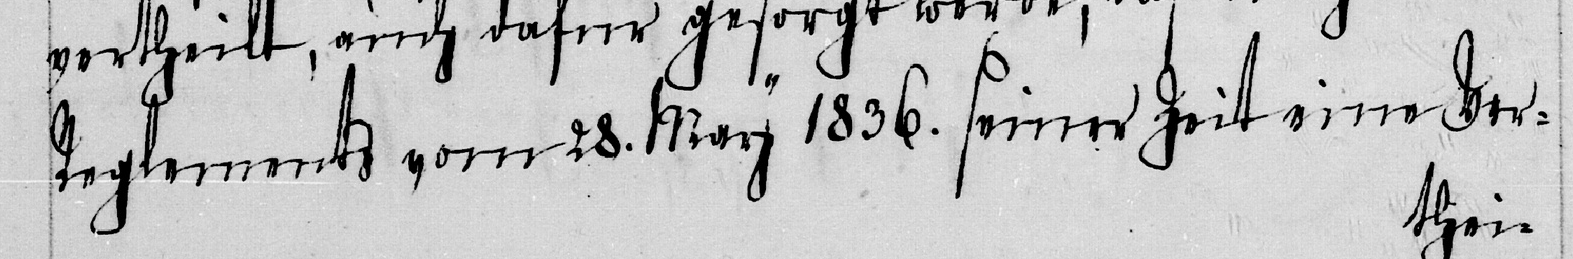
Reglements vom 28. März 1836. seiner Zeit eine Ver-
